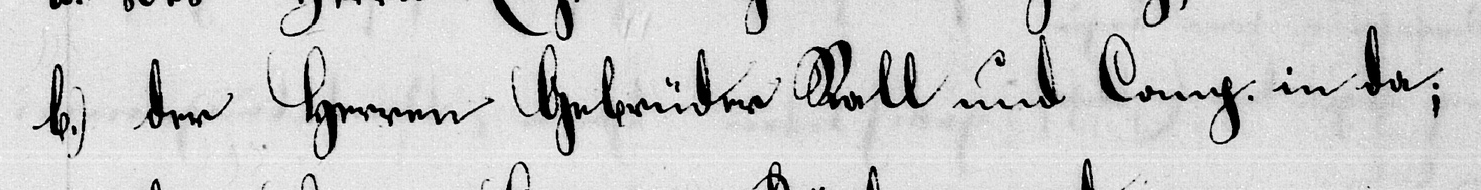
b.) der Herren Gebrüder Rall und Comp. in da;
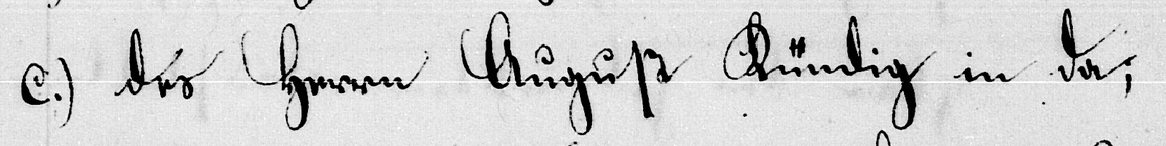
c.) des Herrn August Kündig in da;
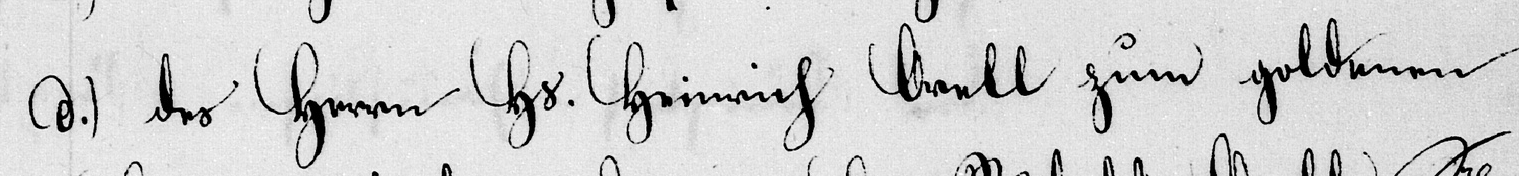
d.) des Herrn Hs. Heinrich Orell zum goldenen
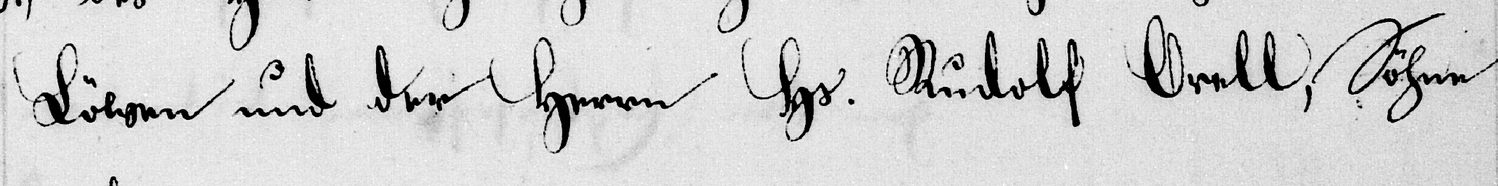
Löwen und der Herrn Hs. Rudolf Orell, Söhne
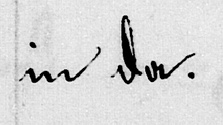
in da.
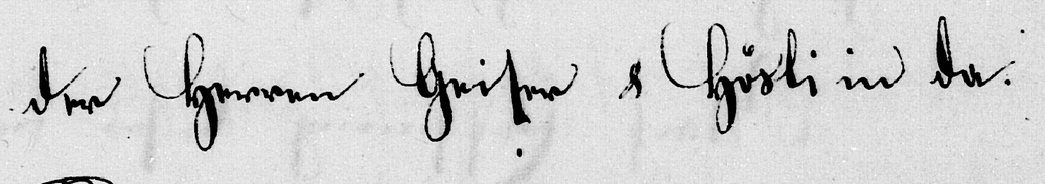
der Herren Geiser & Hösli in da.
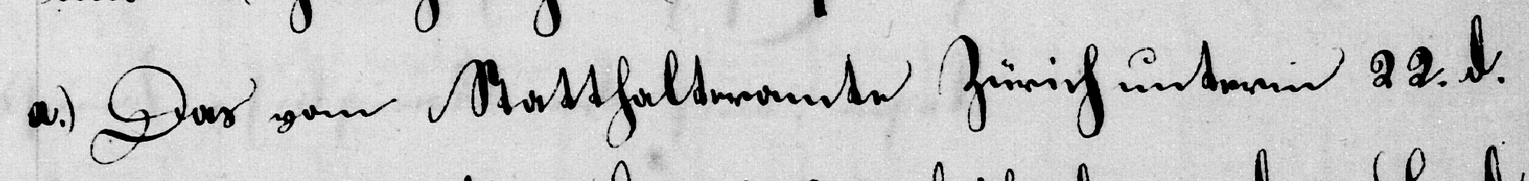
a.) Das vom Statthalteramte Zürich unterm 22. d.
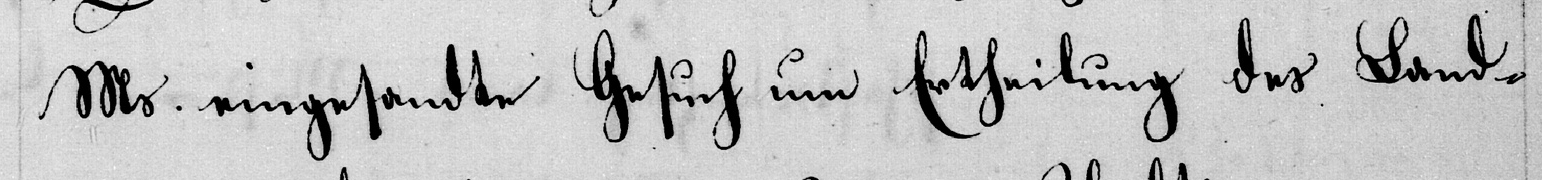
Ms. eingesandte Gesuch um Ertheilung des Land¬
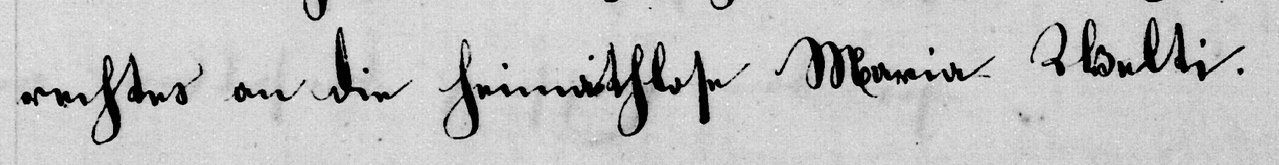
rechtes an die heimathlose Maria Welti.
